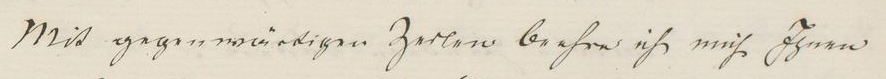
Mit gegenwärtigen Zeilen beehre ich mich Ihnen
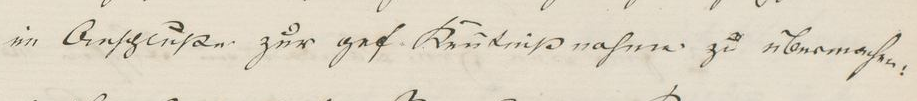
im Anschluße zur gef. Kenntnißnahme zu übermachen:
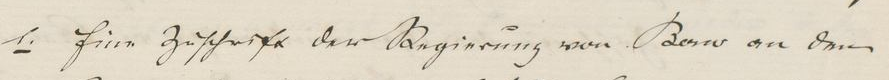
1. Eine Zuschrift der Regierung von Bern an den
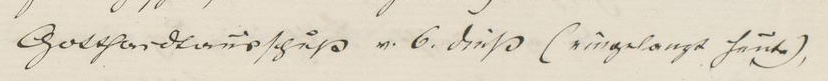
Gotthardtausschuß v. 6. dieß (eingelangt heute),
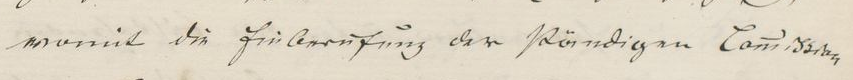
womit die Einberufung der ständigen Commission
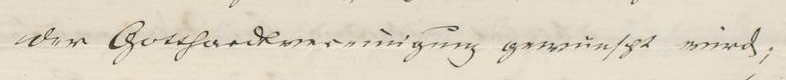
der Gotthardtvereinigung gewünscht wird;
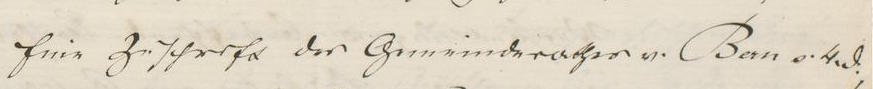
2.Eine Zuschrift des Gemeinderathes v. Bern v. 4.
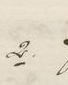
d.,
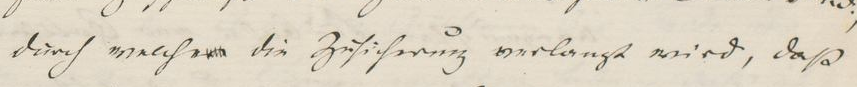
durch welchendie Zusicherung verlangt wird, daß
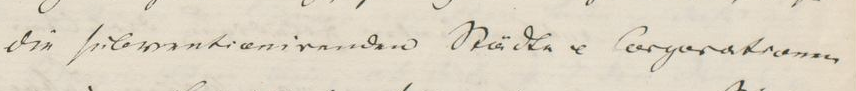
die subventionirenden Städte & Corporationen
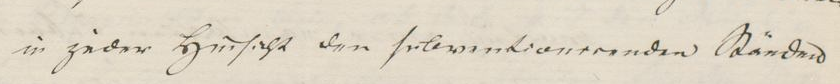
in jeder Hinsicht den subventionirenden Ständen
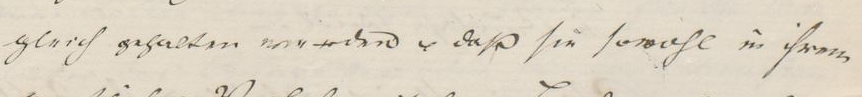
gleich gehalten werden & daß sie sowohl in ihrem
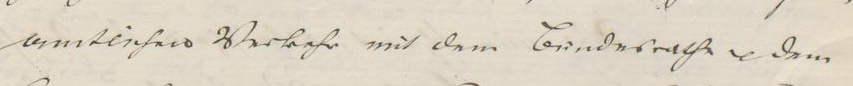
amtlichen Verkehr mit dem Bundesrathe & dem
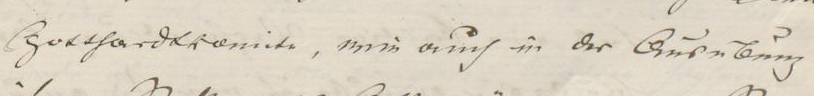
Gotthardtkomite, wie auch in der Ausübung
